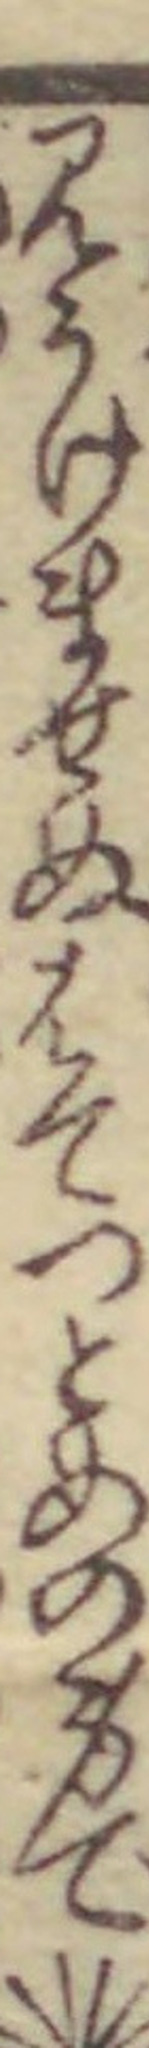見うけませぬはてつとめの身で
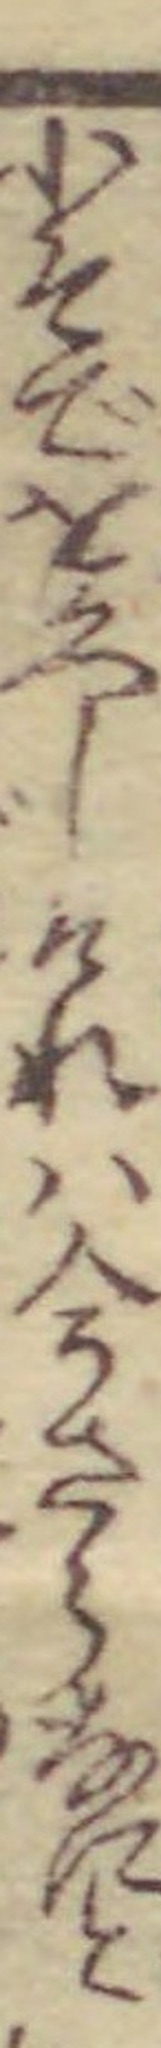小そでをかへしけれは今さらなにと
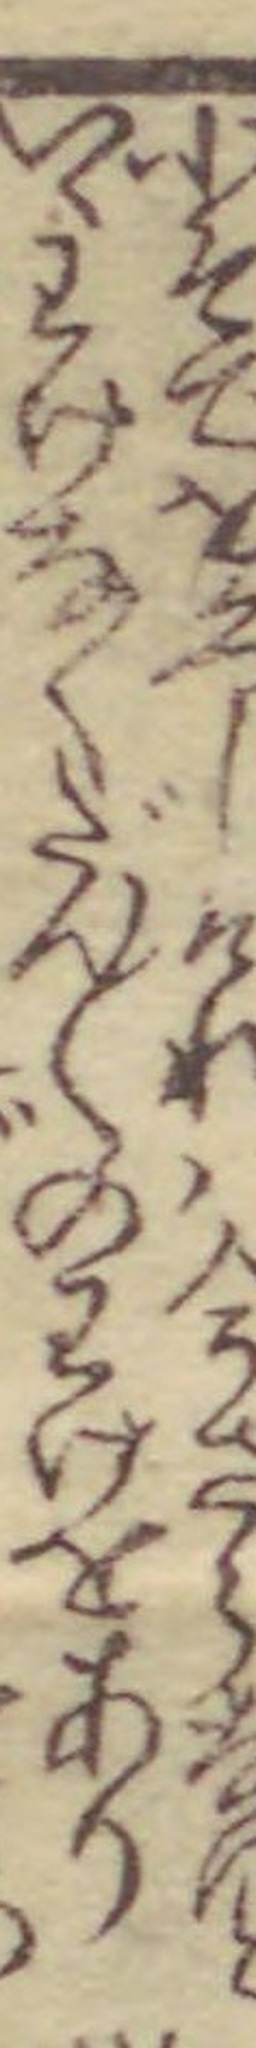いゝわけなくだん〳〵のわけをあり
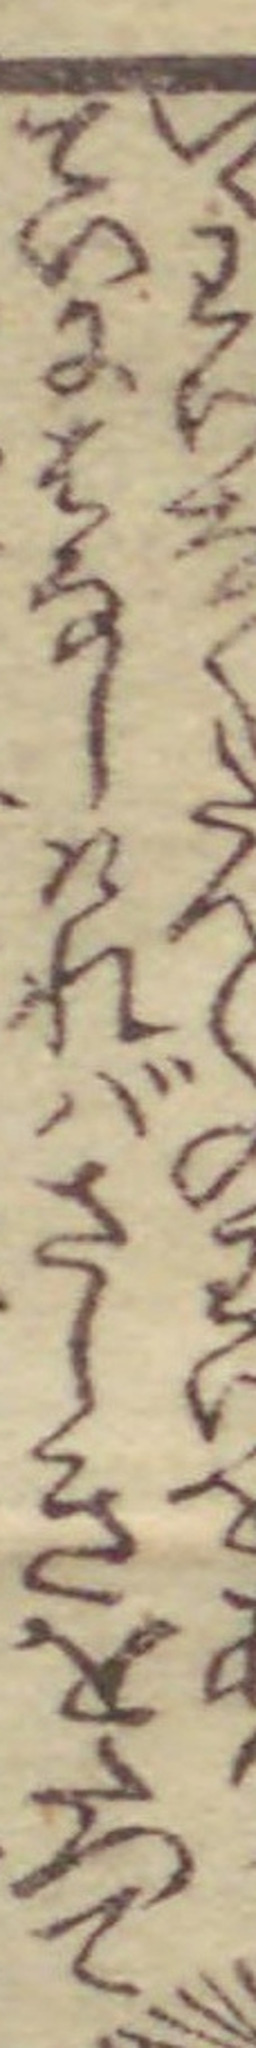ていにはなしければさしきをたつて
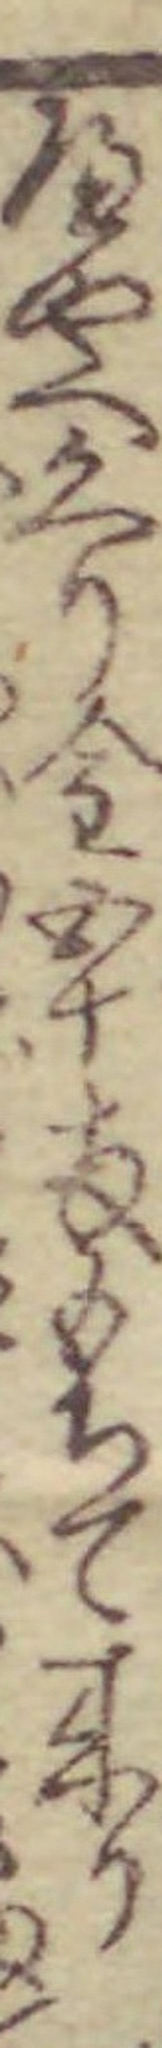へやへかへり金五十両もちて来り
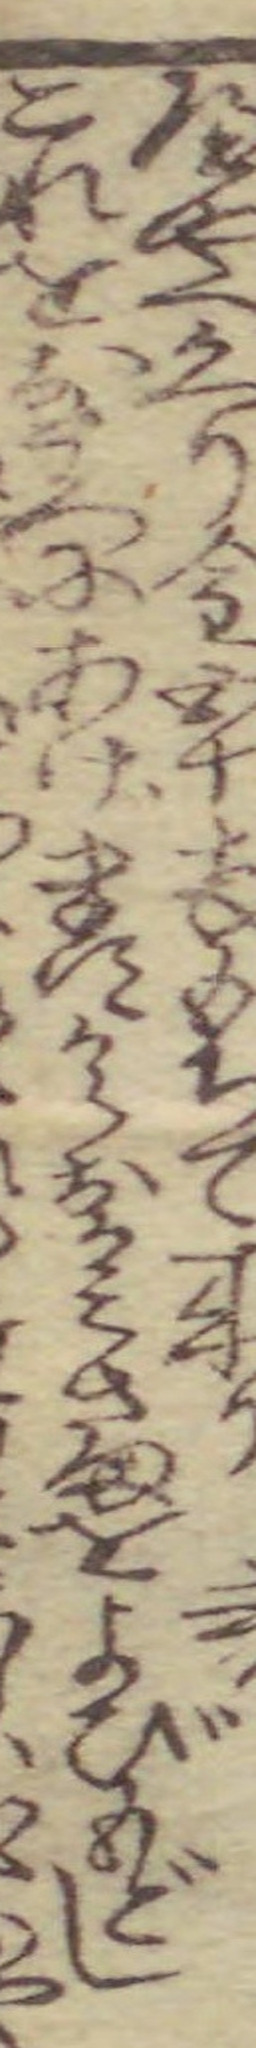これをおまへにあけますからおかみさまをよびもどし
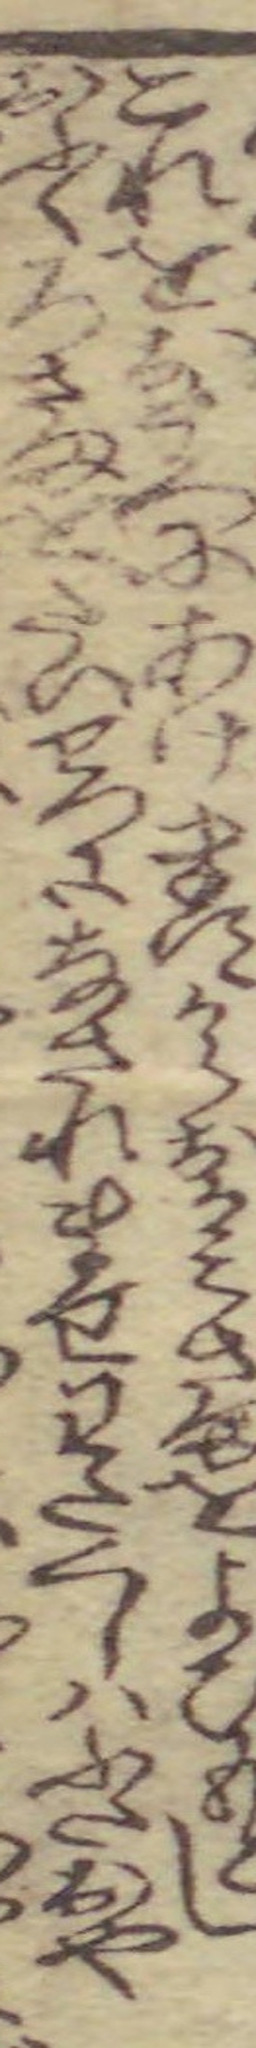おふくろさまをたいせつになされませわたくしはふたおや
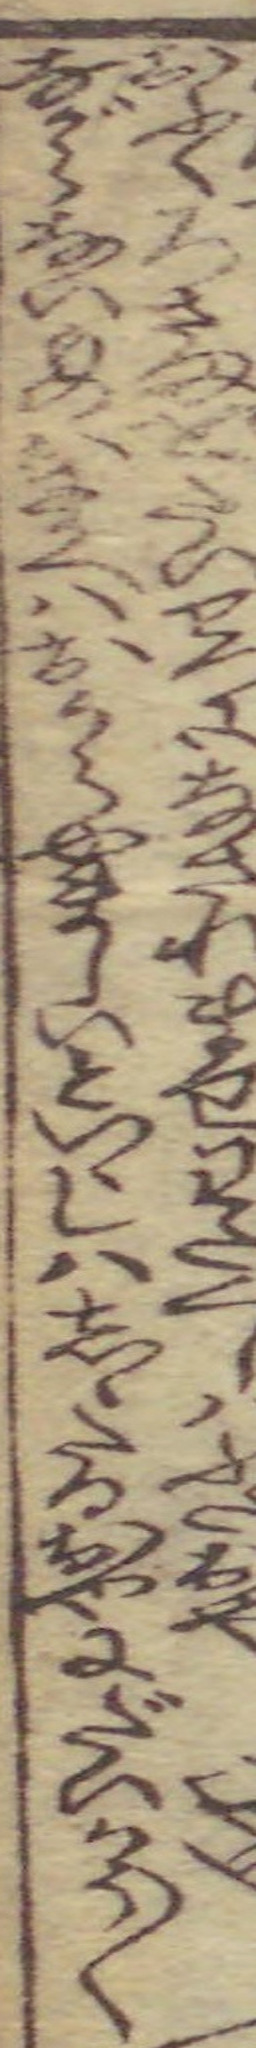ながらないものおまへはおうらやましいといゝしはしゝたるおやにだいかう〳〵なり

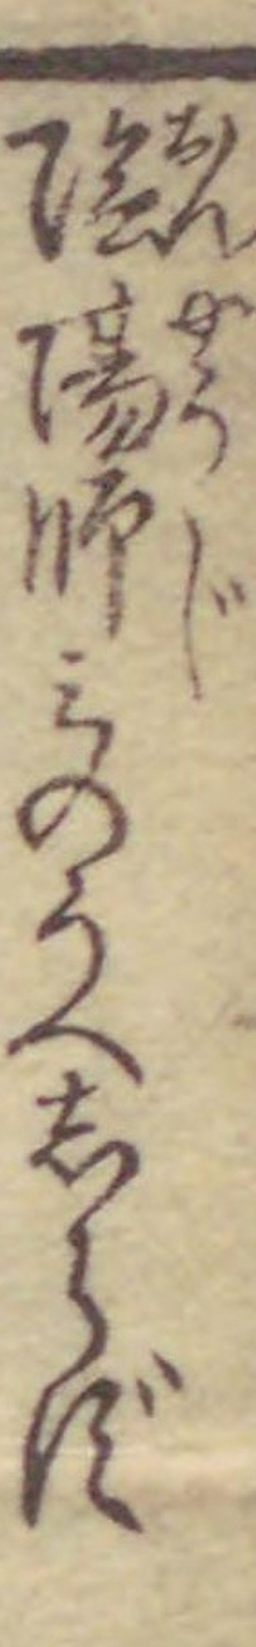陰陽師みのうへしらず
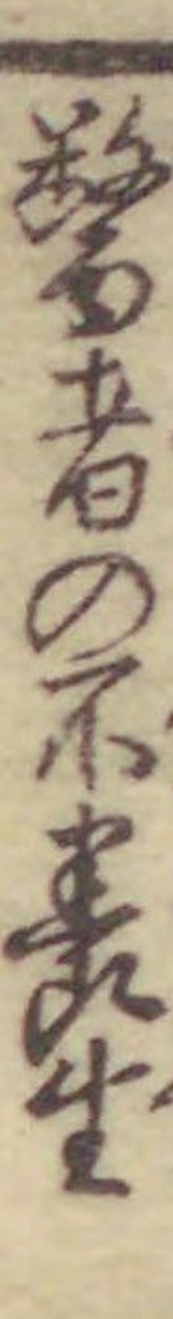医者の不養生
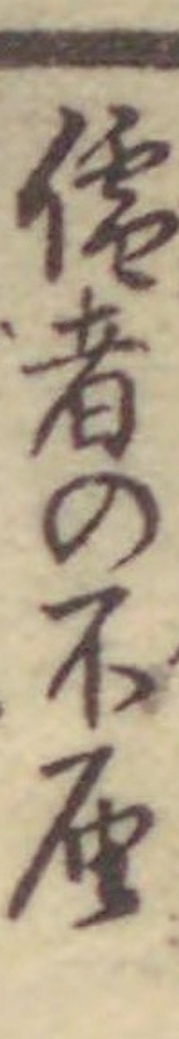儒者の不届
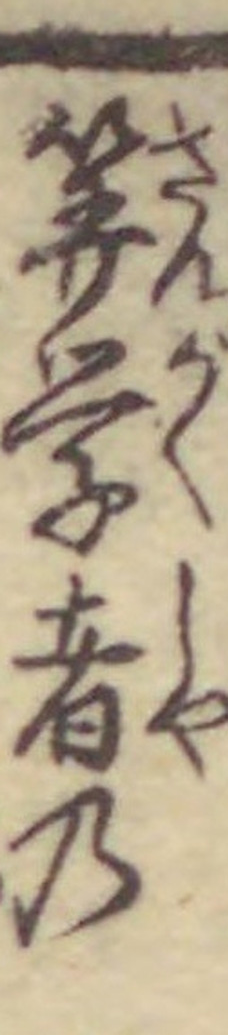算学者の
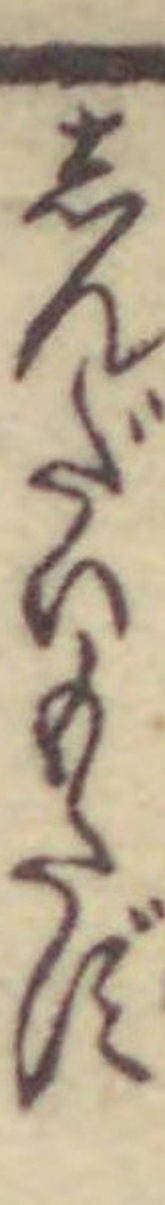しんだいもたず
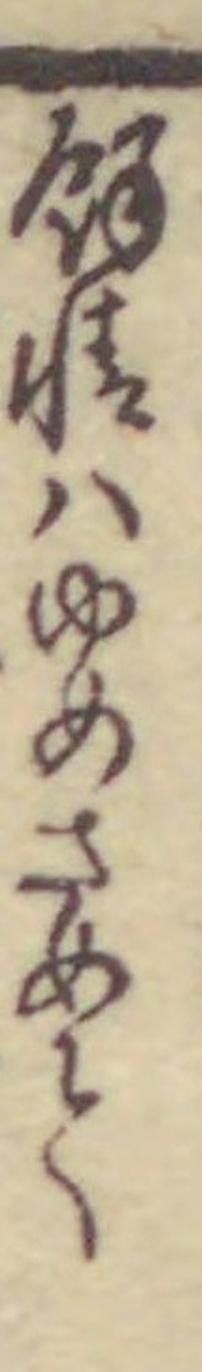余情はゆめのさめて
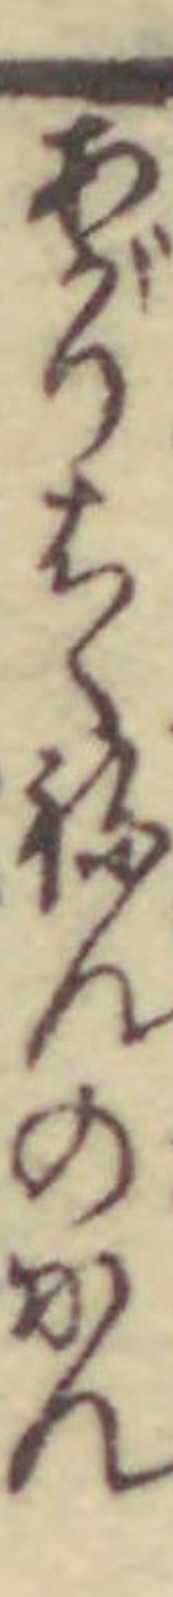あがりはくねんのかん
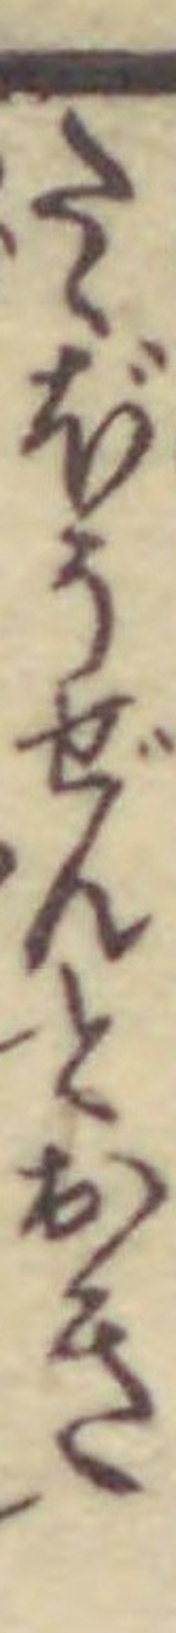たゝぼうぜんとおき
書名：大通人穴[サガシ] 3巻
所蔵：国立国会図書館 National Diet Library, JAPAN
